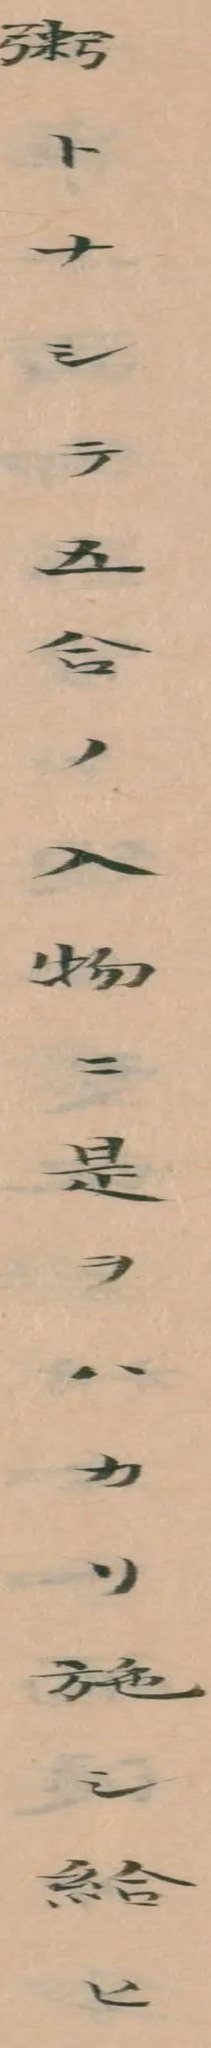粥トナシテ五合ノ入物二是ヲハカリ施シ給ヒ
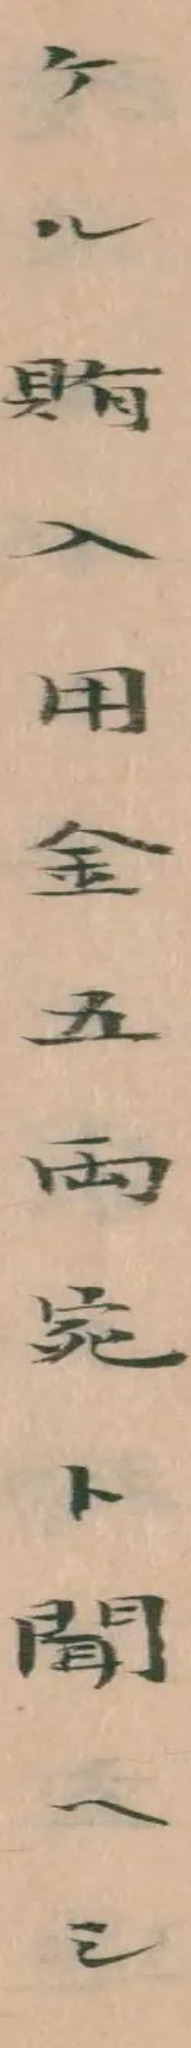ケル賄入用金五両宛ト危機聞へシ
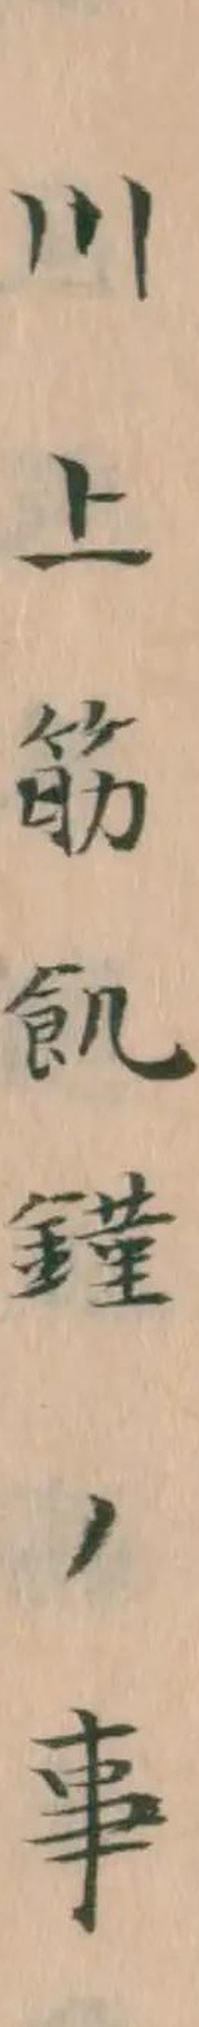川上筋飢饉ノ事
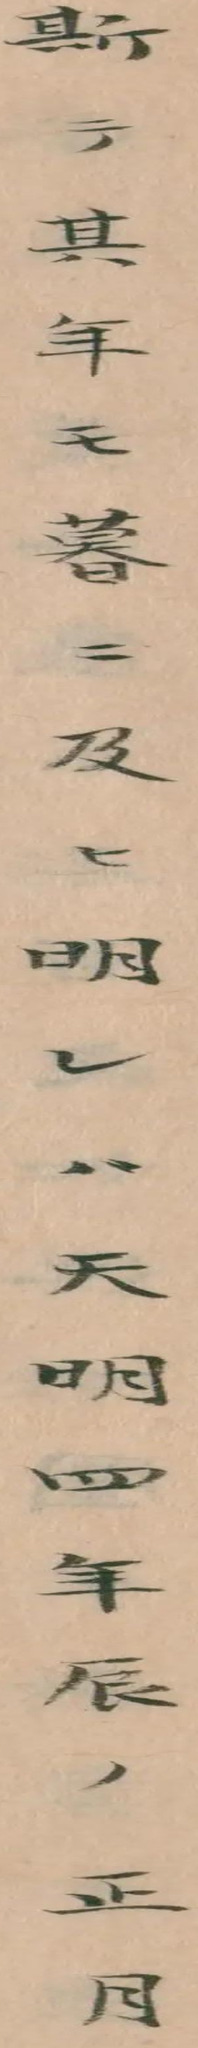斯テ其年モ暮二及ヒ明レハ天明四年辰ノ正月
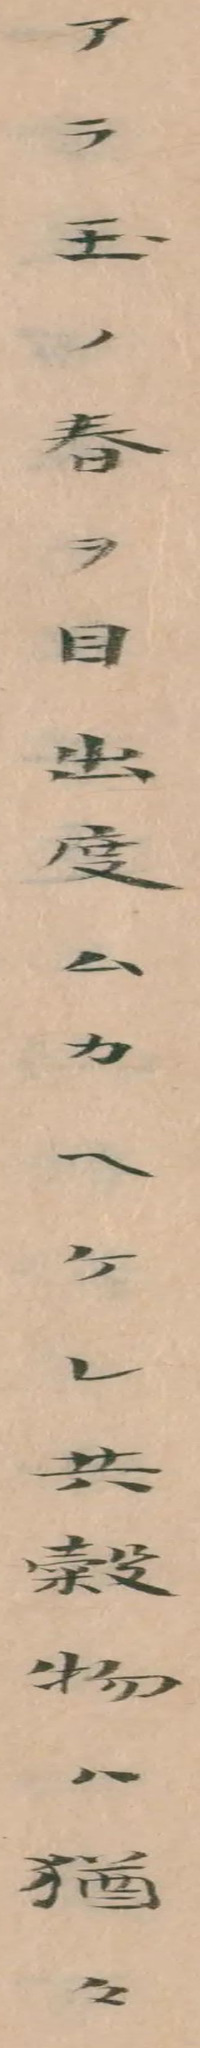アラ玉ノ春ヲ目出度ムカへケレ共穀物ハ猶々
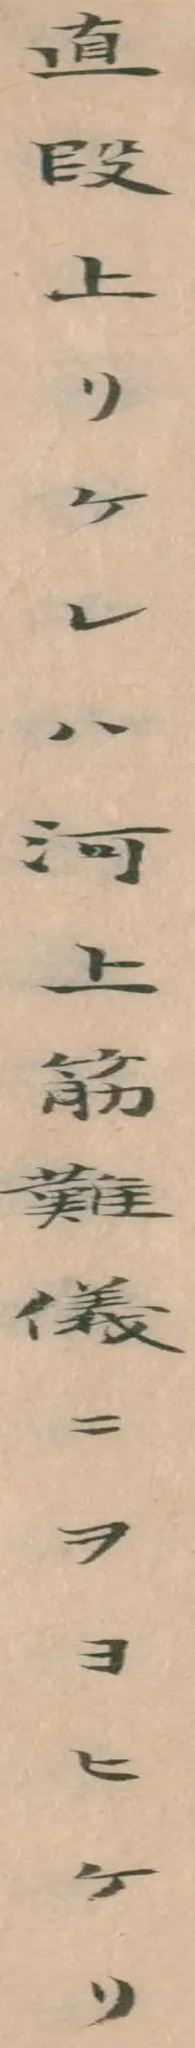直段上リケレハ河上筋難儀二ヲヨヒケリ
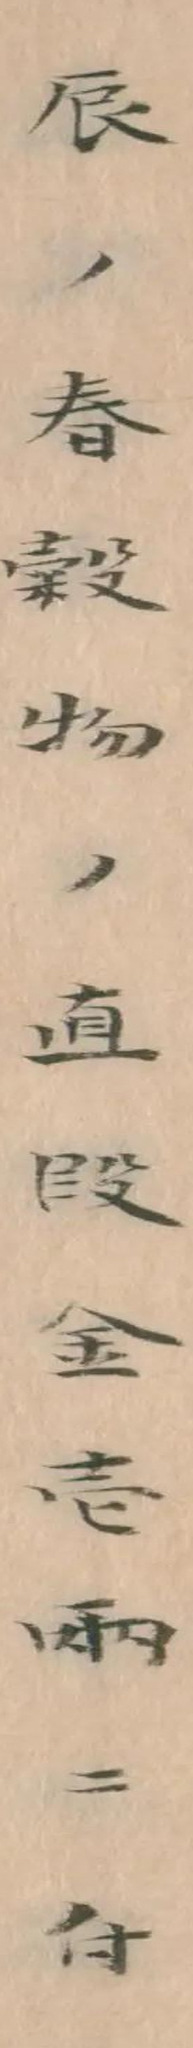辰ノ春穀物ノ直段金壱両二付
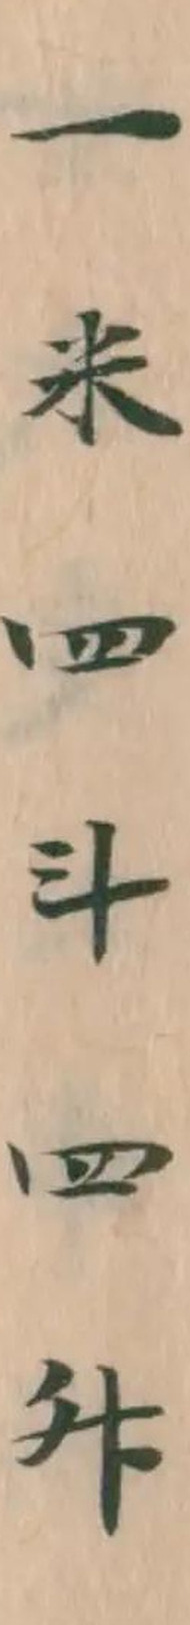一米四斗四升一大豆六斗五升
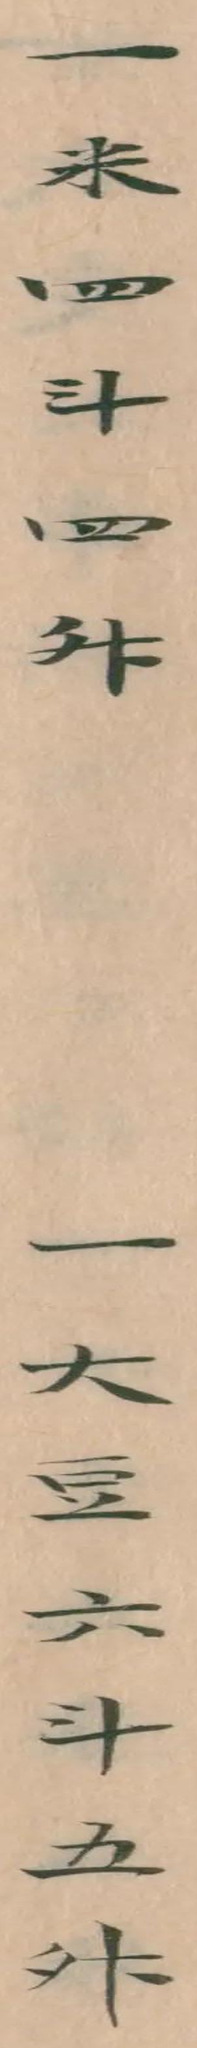一米四斗四升一大豆六斗五升

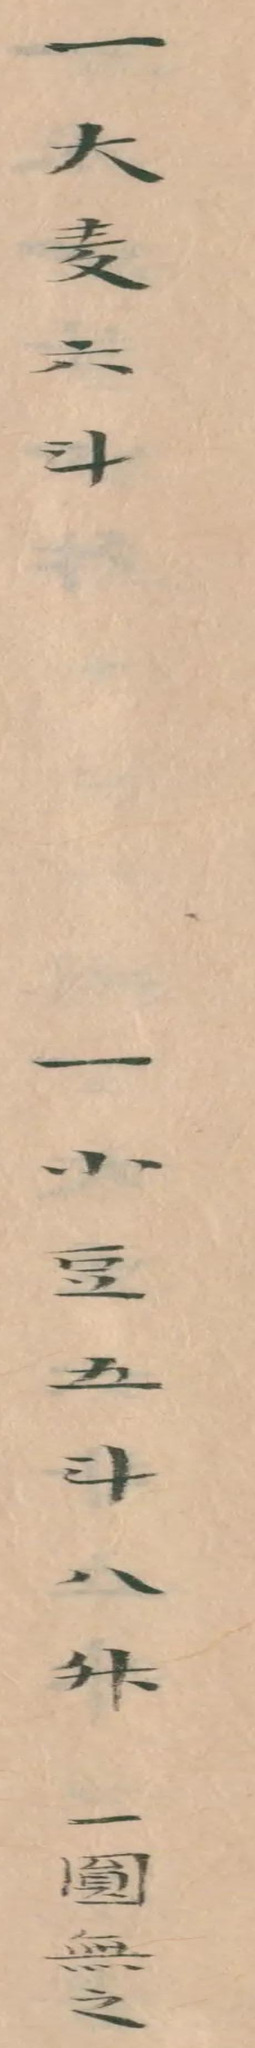一大麦六斗一小豆五斗八升一円無之
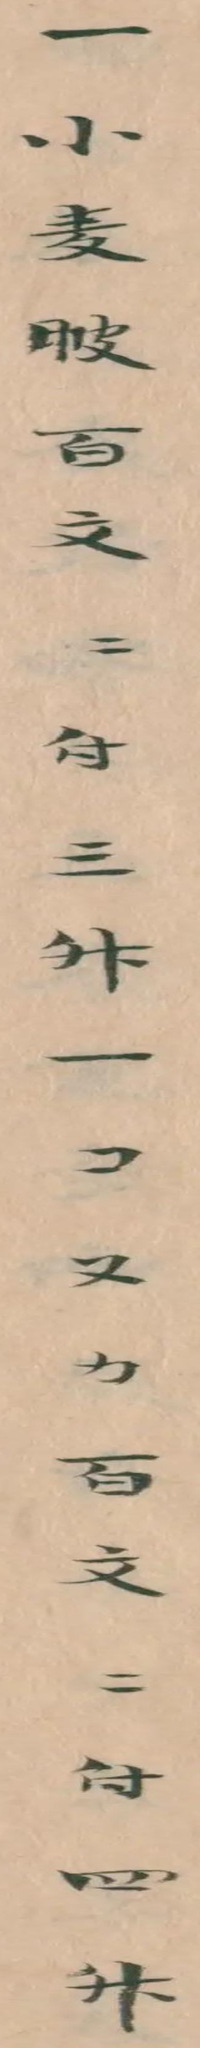一小麦百文二付三升一コヌカ百文二付四升
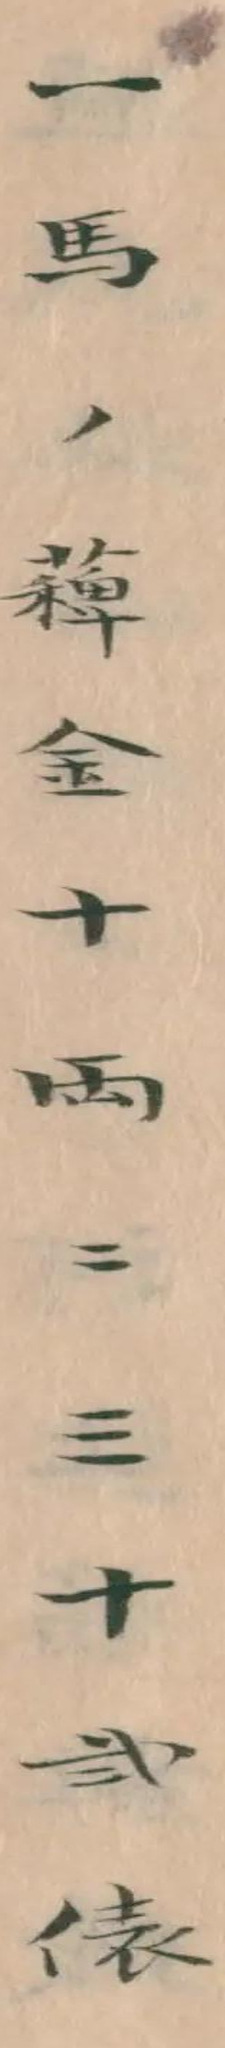一馬ノ薭金十両二三十弐俵
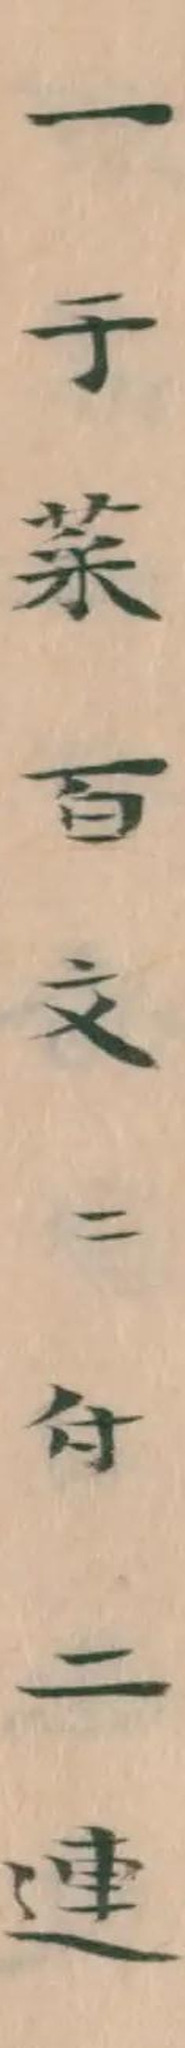一干菜百文二付二連
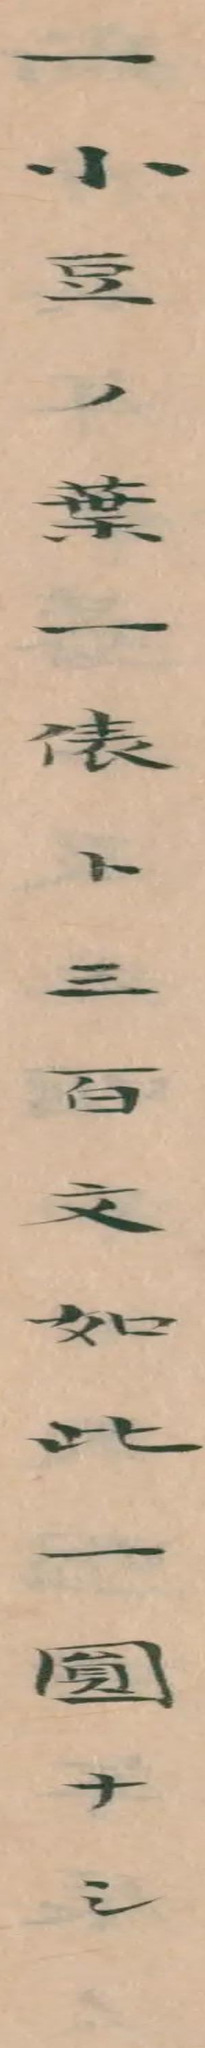一小豆ノ葉一俵ト三百文如此一円ナシ
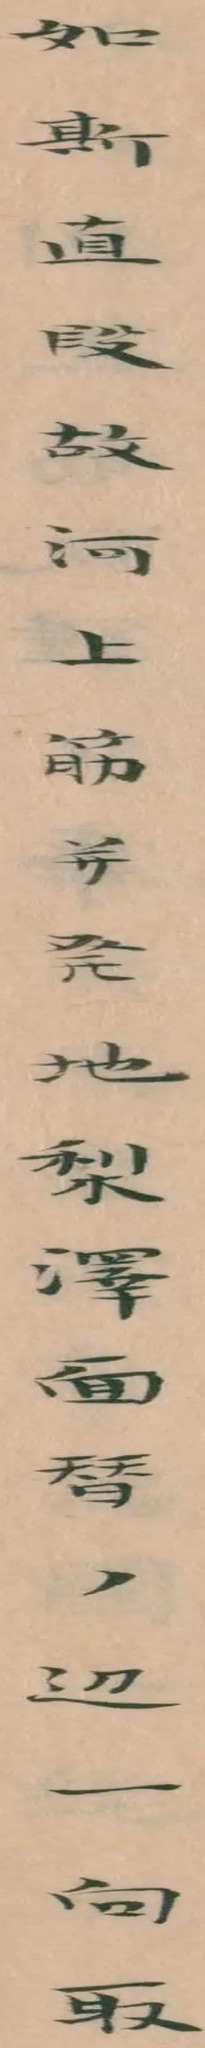如斯直段故河上筋并発地梨沢面替ノ辺一向取
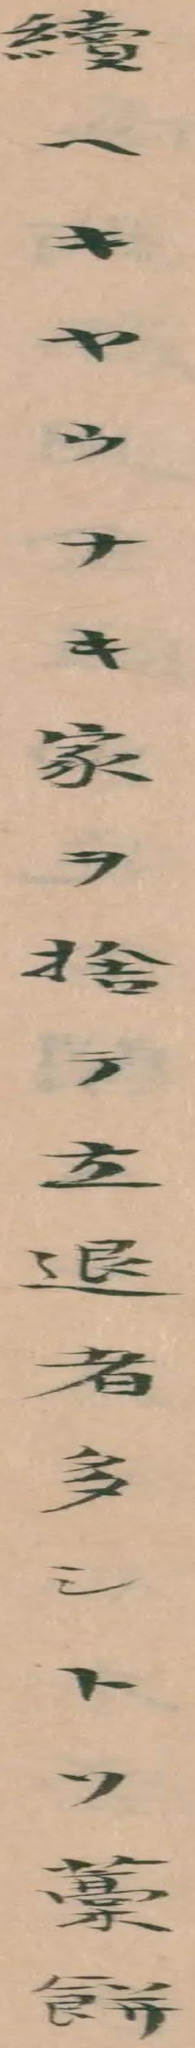続ヘキヤウナキ家ヲ捨テ立退者多シトソ藁餅
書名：地災撮要. 巻3(地震之部)-巻4(噴火之部)
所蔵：国立国会図書館 National Diet Library, JAPAN
